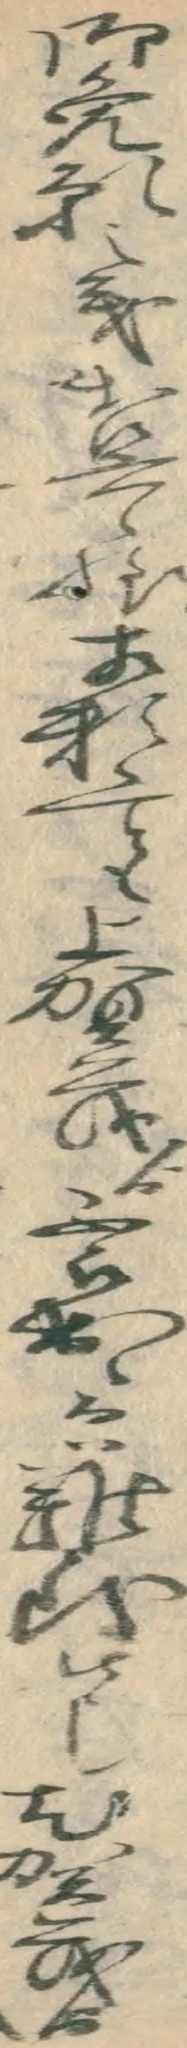御免願之義出呉候様ニ相頼候へとも上賀茂ゟ不被出候而ハ難致由申候尤賀茂ゟも
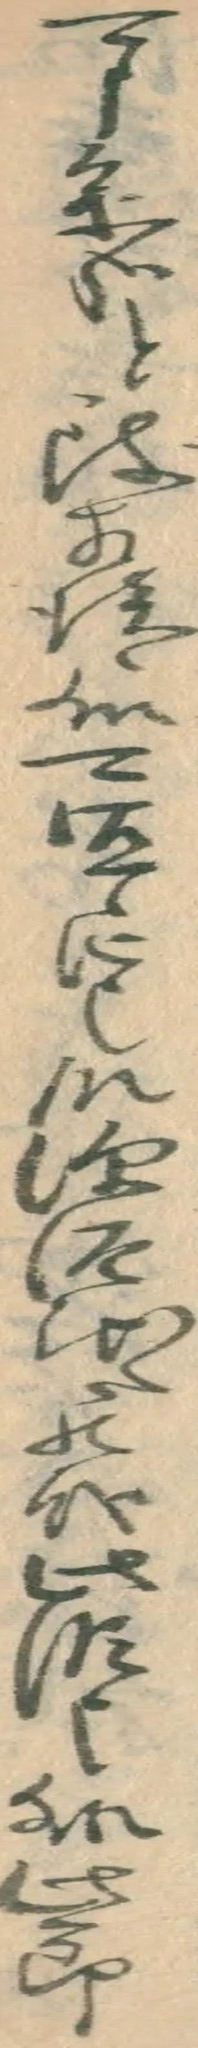可申参哉と致相談候処可宜候由申候故深泥池へ罷越此段申候処此節

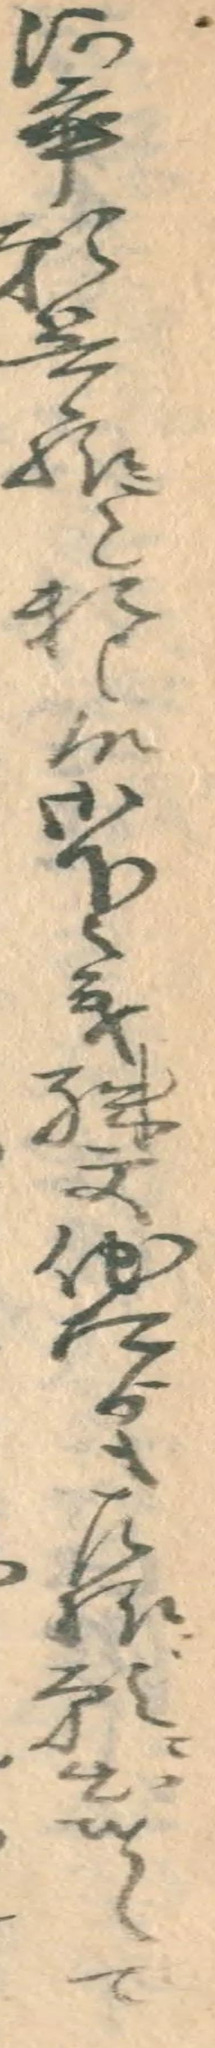何卒願呉候様ニと頼申候故御下之義殊更他郷ゟも左様ニ願ニ出遣候て
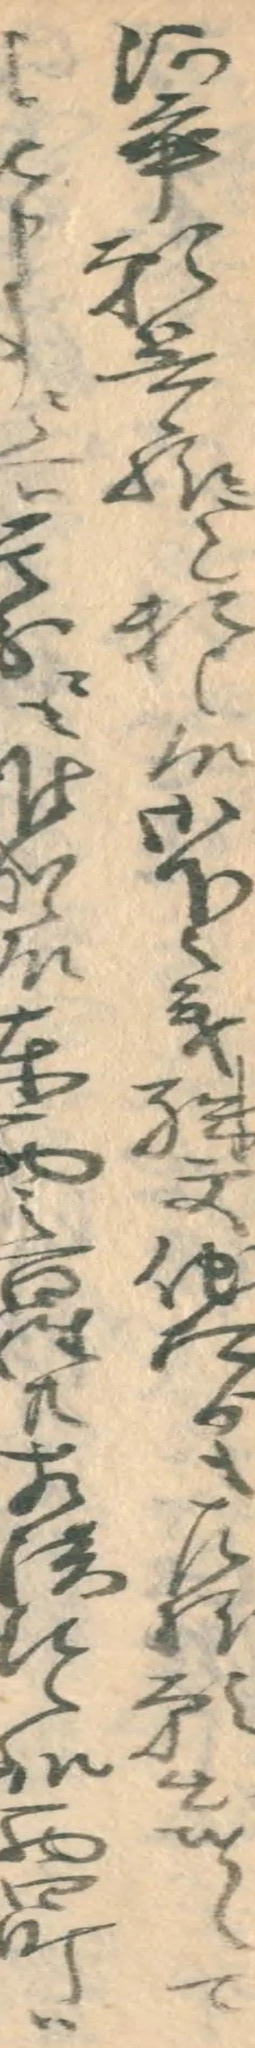申候由申事ニ候へハ其分ニも難成候故東西之百姓共相談仕候処西四町ハ
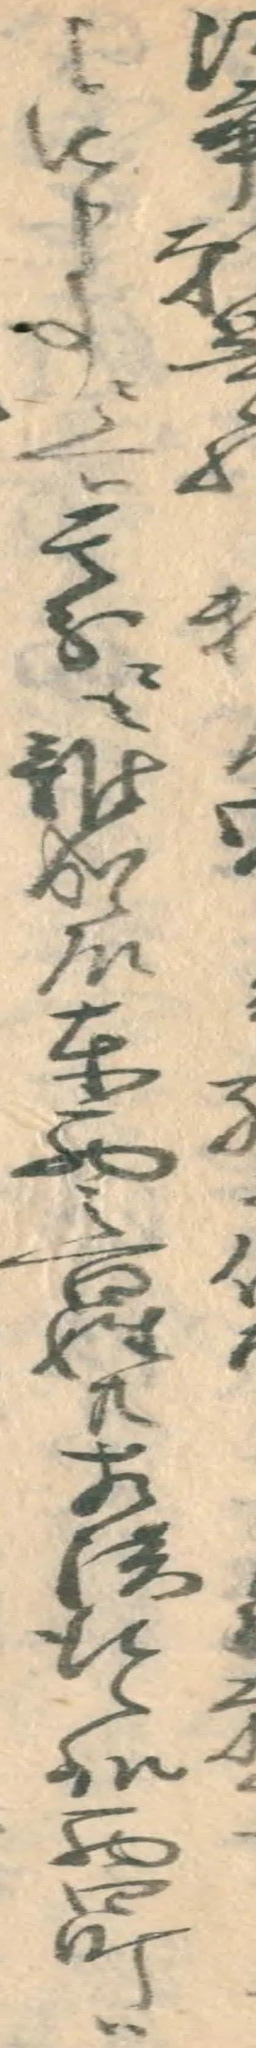申候由申事ニ候へハ其分ニも難成候故東西之百姓共相談仕候処西四町ハ
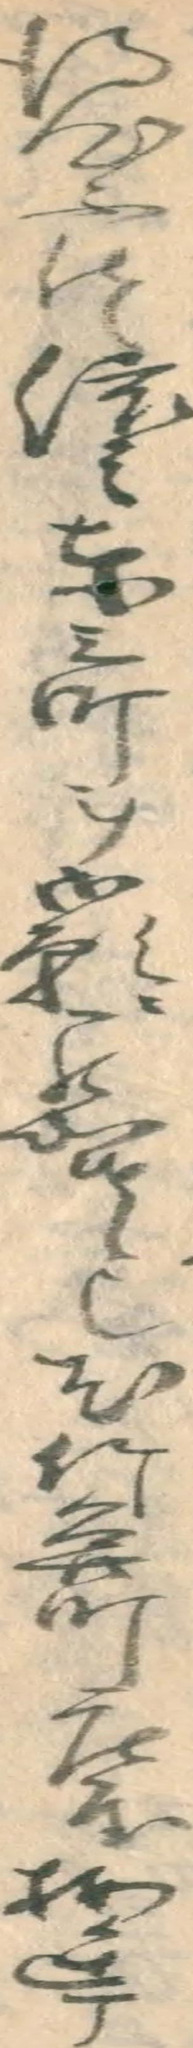得心不仕候依之東三町計御願ニ罷出遣候申候尤竹鼻町庄屋梅か辻町
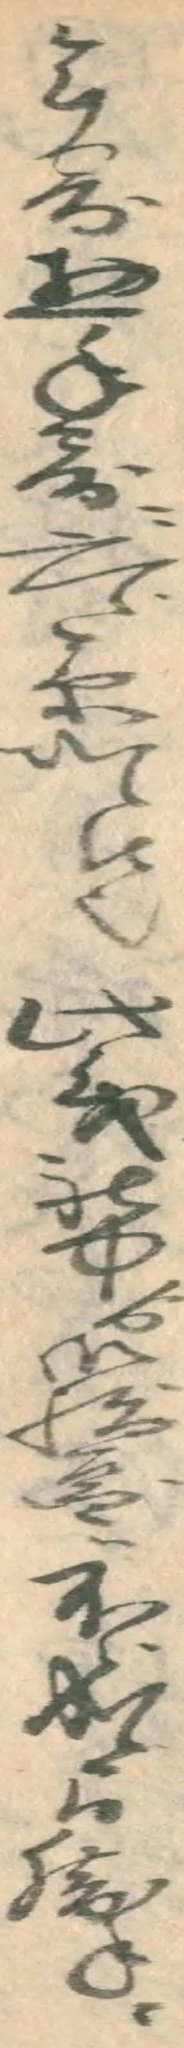年寄惣手寄ニ六郎兵衛出候由也此義社中ゟ御指図ハ不被成候間勝手ニ
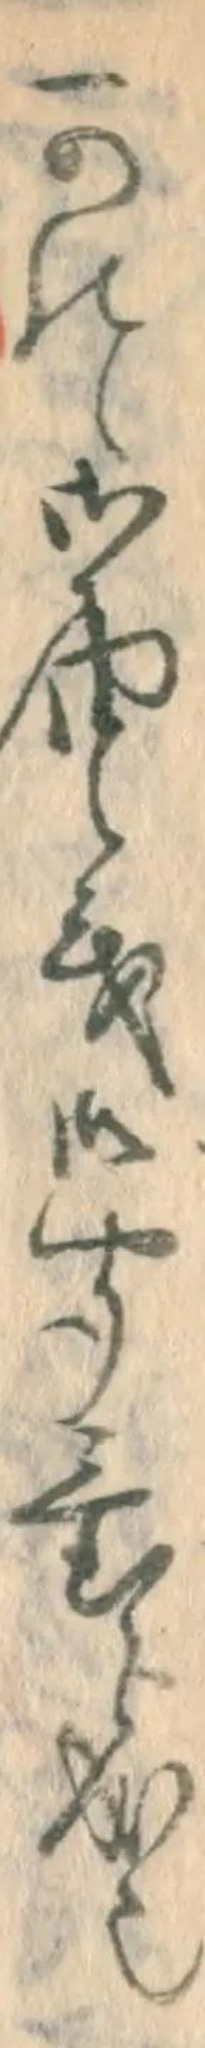可仕候御届之義御聞置被成也
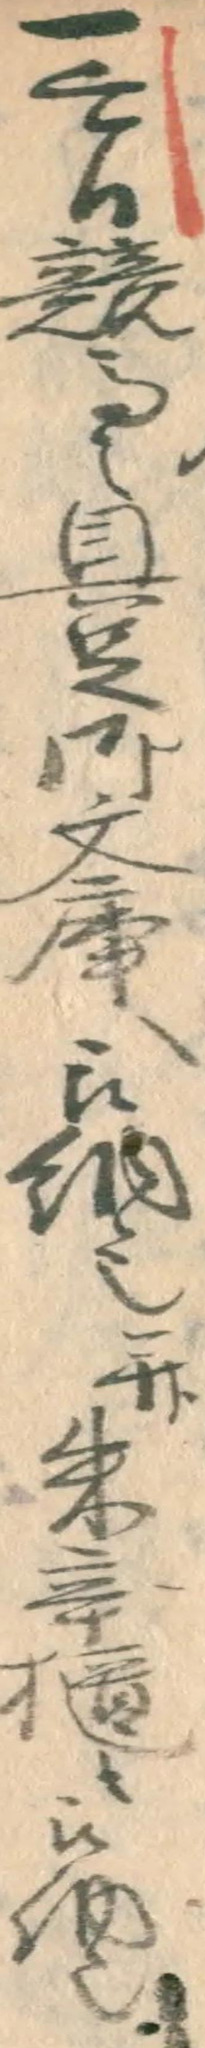一今日競馬之具足御文庫へ被納候也并朱辛櫃も被納也
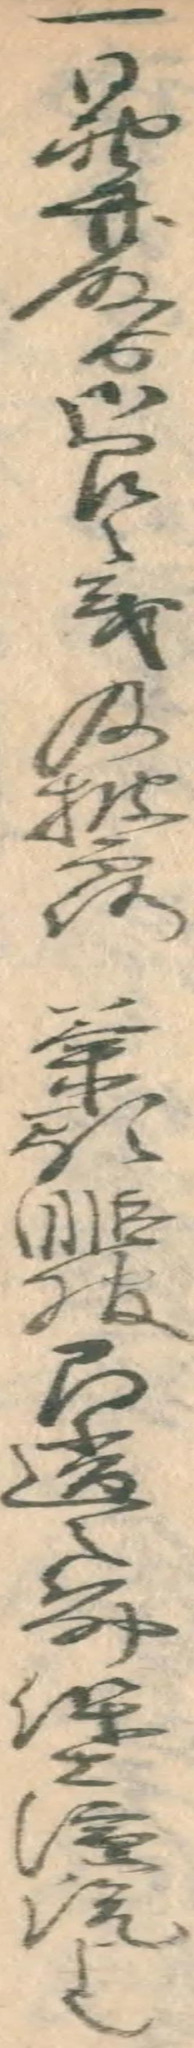一日野弁殿ゟ御召之義及披露菊顕暇服間違之筋保土演説申也
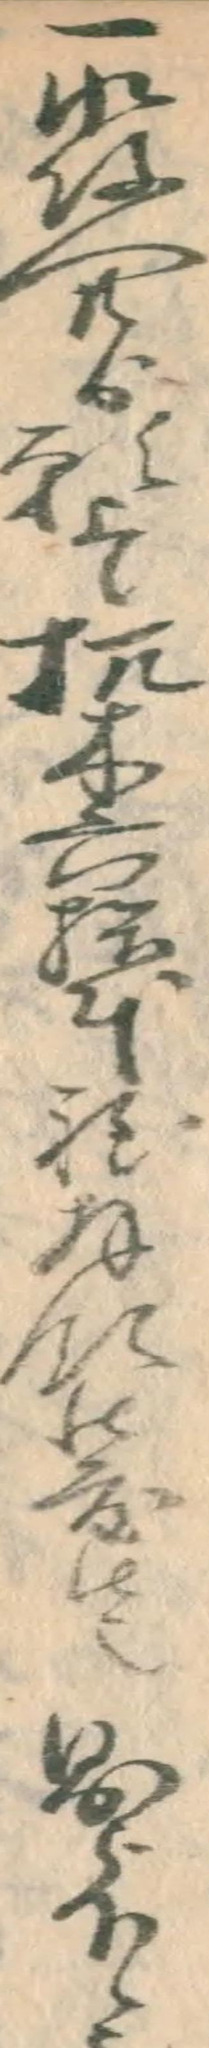一水役人共ゟ願上候杭木六拾本程拝領仕度由也則被下候也
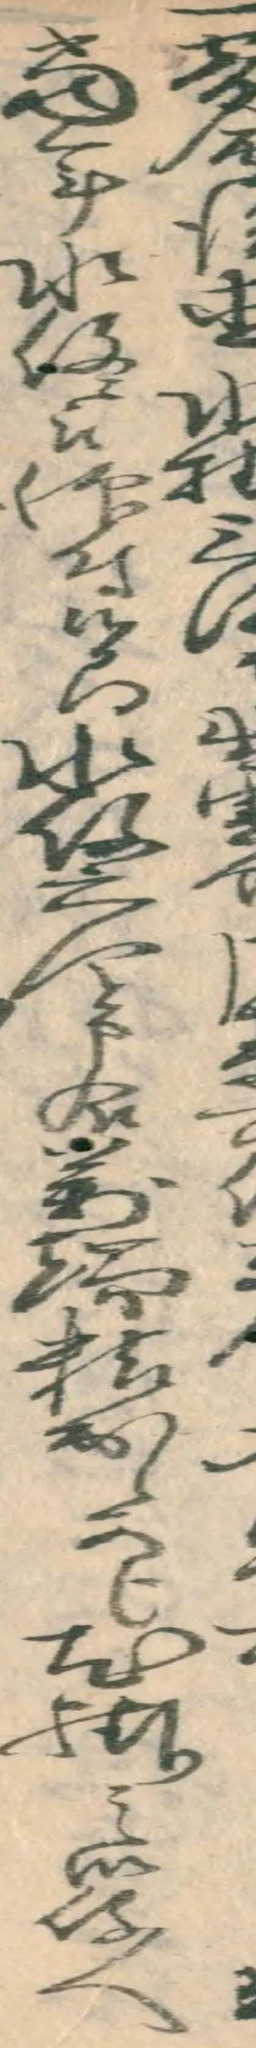当年水役ニ被仰付候間水役六人と申合万端精出し可申候尤掛り之御役人
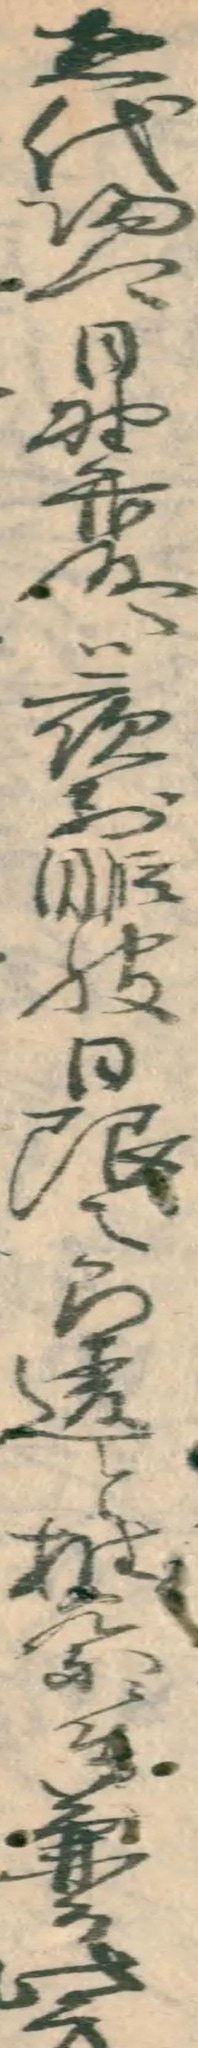一惣代帰郷日野弁殿へハ夜前暇服日限之間違と推察ニ付兼而此方ゟ
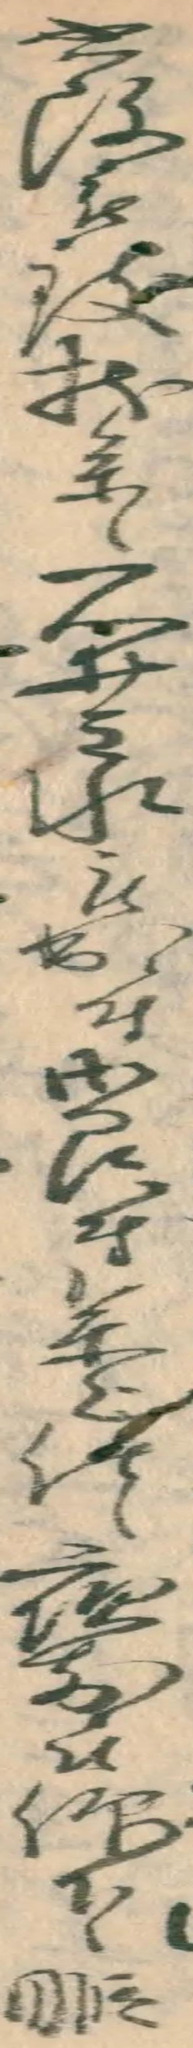書改被致持参候石井主水被出候付御召ニ付参上仕候夜前被仰下候暇
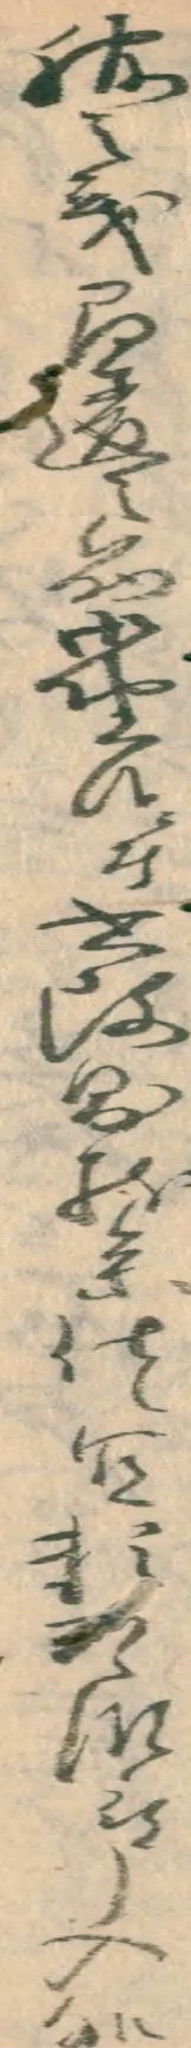服之義間違之筋御坐候ニ付書改則持参仕候宜頼候段被申入処
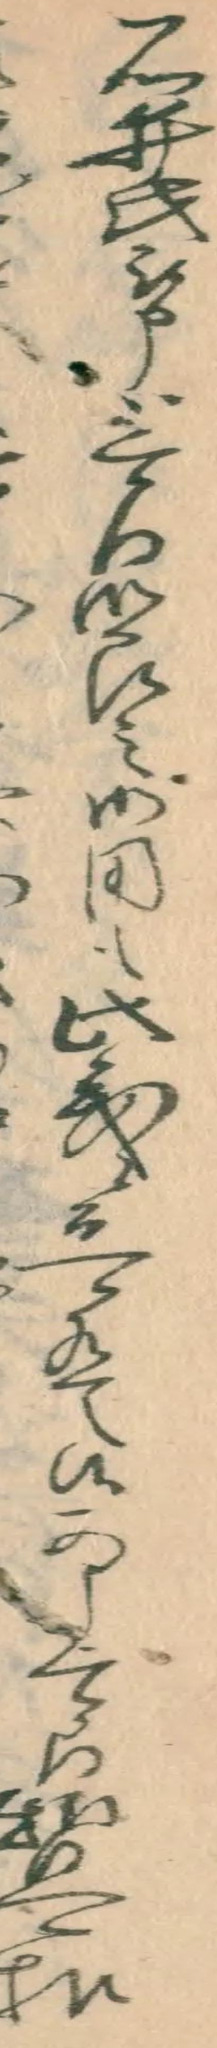石井氏被申ハ今日御召之御用も此義ニ而可有之候可申上候間暫可扣
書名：賀茂社記録. 第58冊
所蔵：国立国会図書館 National Diet Library, JAPAN
